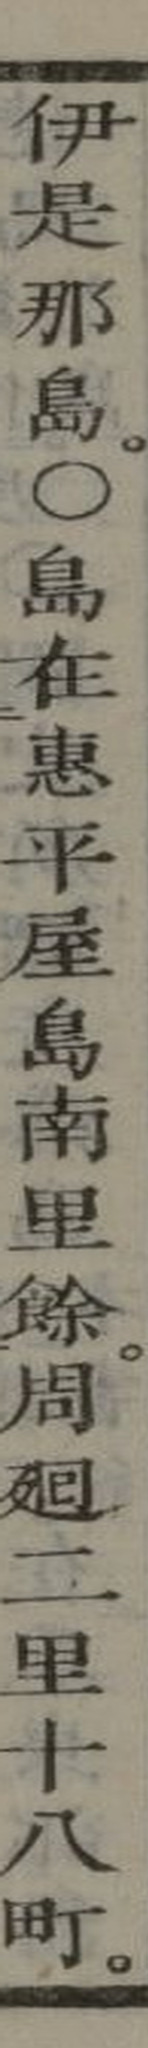伊是那島。○島在惠平屋島南里餘。周廻二里十八町。
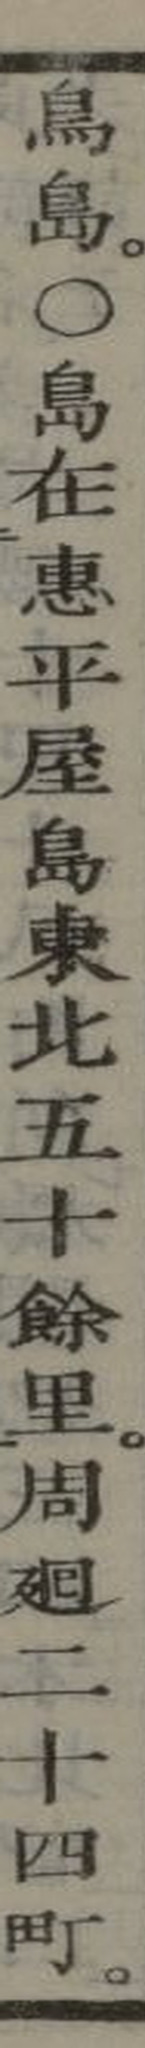鳥島。○島在惠平屋島東北五十餘里。周廻二十四町。
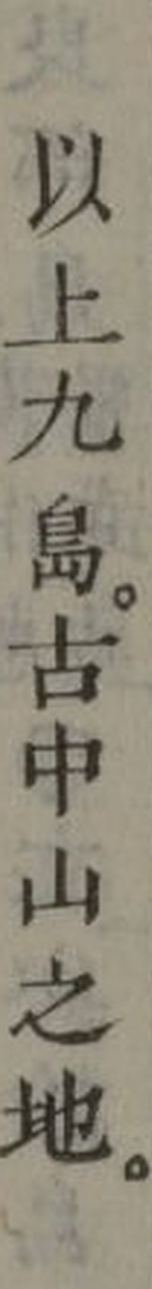以上九島。古中山之地。

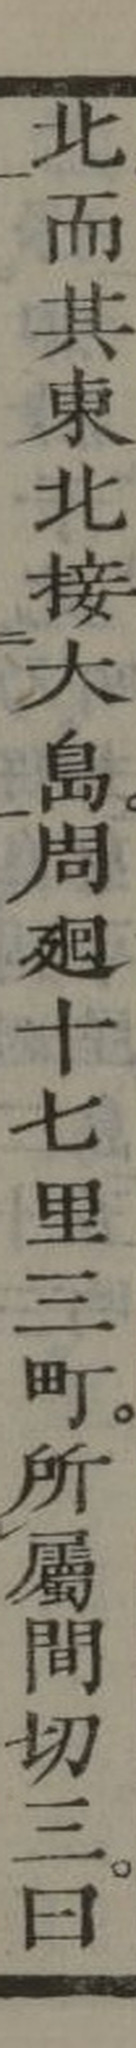北。而其東北接大島。周廻十七里三町。所屬間切三。曰
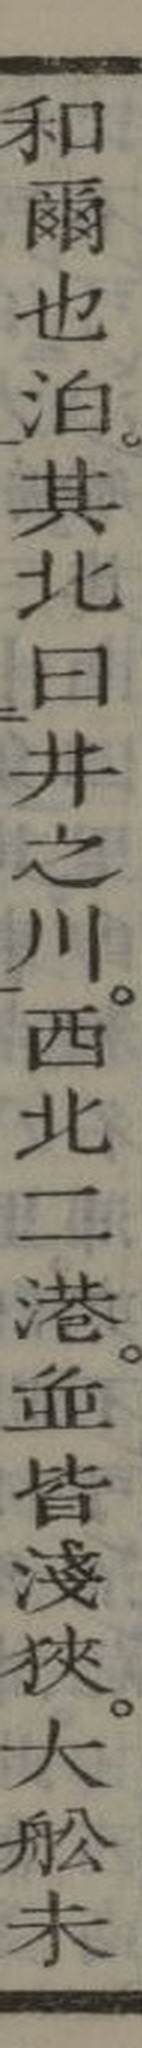和爾也泊。其北曰井之川。西北二港。並皆淺狹。大舩未
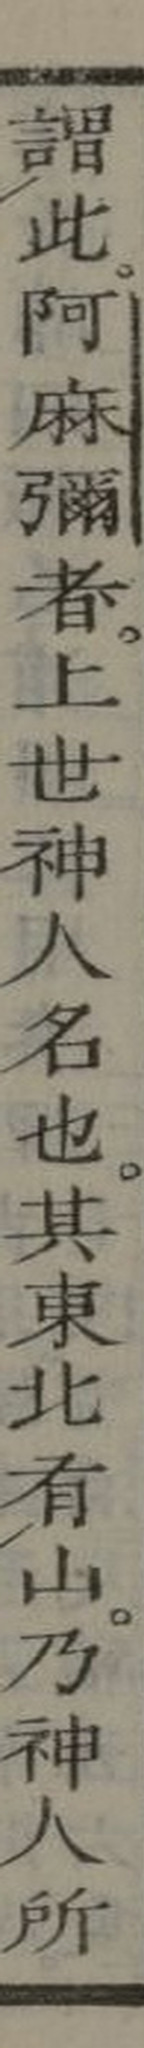謂此。阿麻彌者。上世神人名也。其東北有山。乃神人所
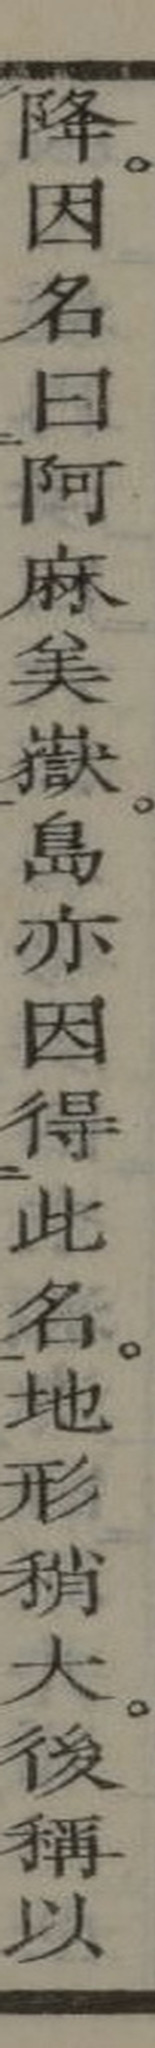降。因名曰阿麻美嶽。島亦因得此名。地形稍大。後稱以

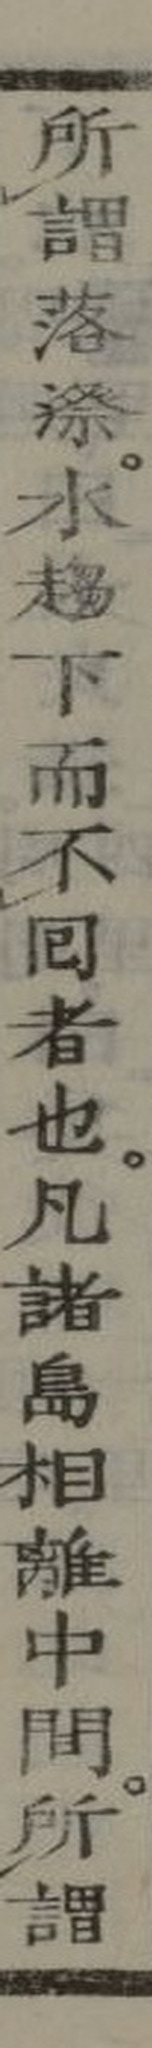所謂落漈。水趨下而不囘者也。凡諸島相離中間。所謂
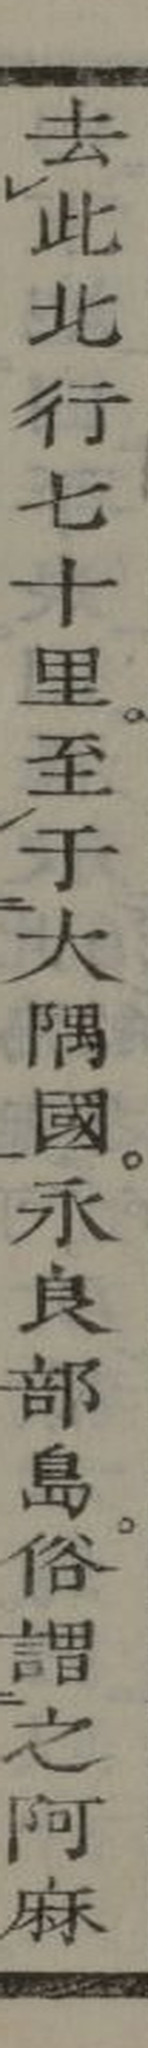去此北行七十里。至于大隅國。永良部島。俗謂之阿麻

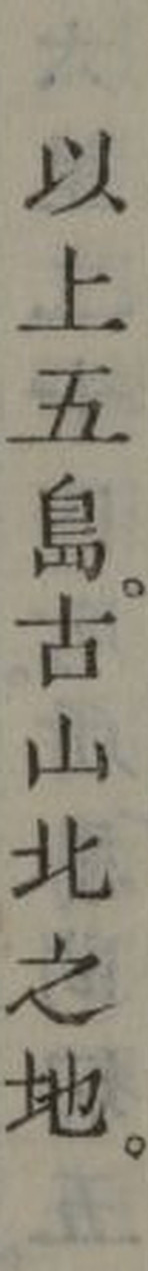以上五島。古山北之地。
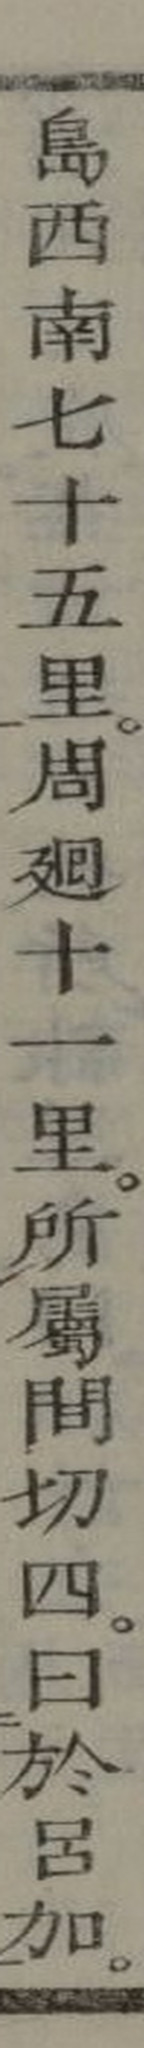島西南七十五里。周廻十一里。所屬間切四。曰於呂加。
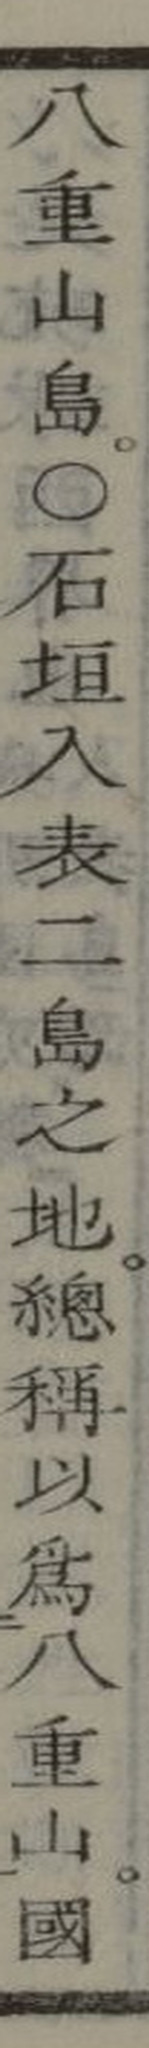八重山島。○石垣入表二島之地。總稱以爲八重山。國
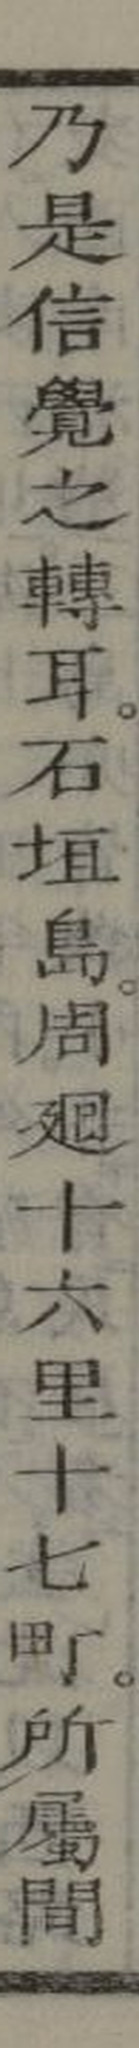乃是信覺之轉耳。石垣島。周廻十六里十七町。所屬間
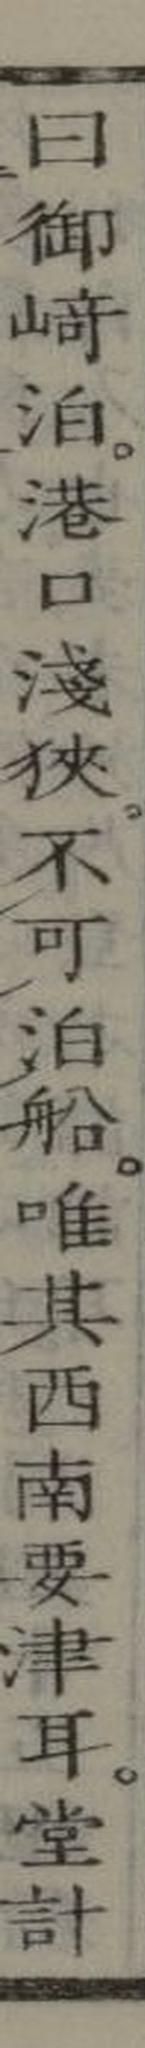曰御﨑泊。港口淺狹。不可泊船。唯其西南要津耳。堂計

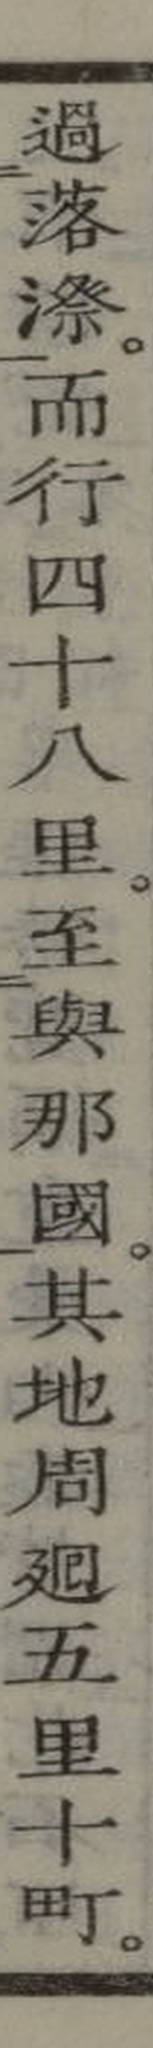過落漈。而行四十八里。至與那國。其地周廻五里十町。
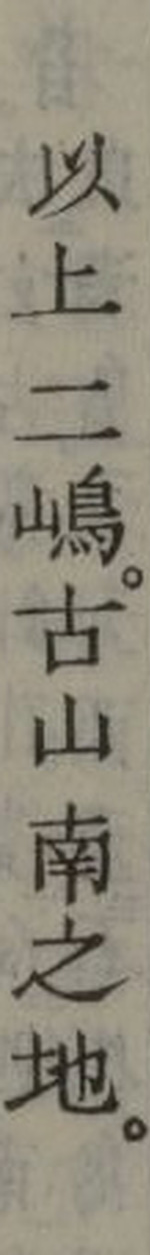以上二嶋。古山南之地。
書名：南島志 呂
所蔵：University of the Ryukyus Library
